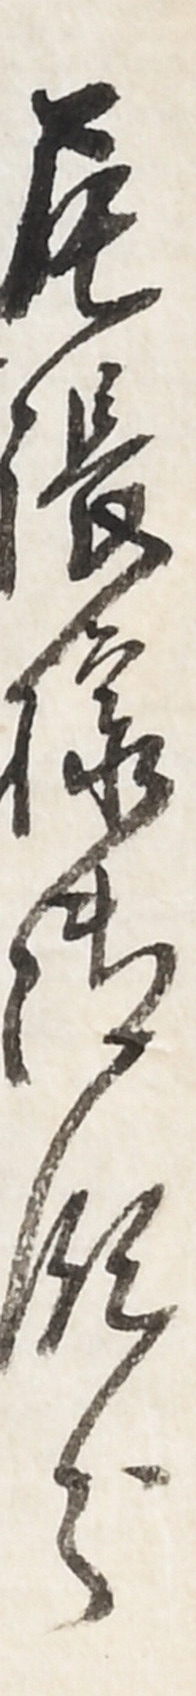尾張様御領分
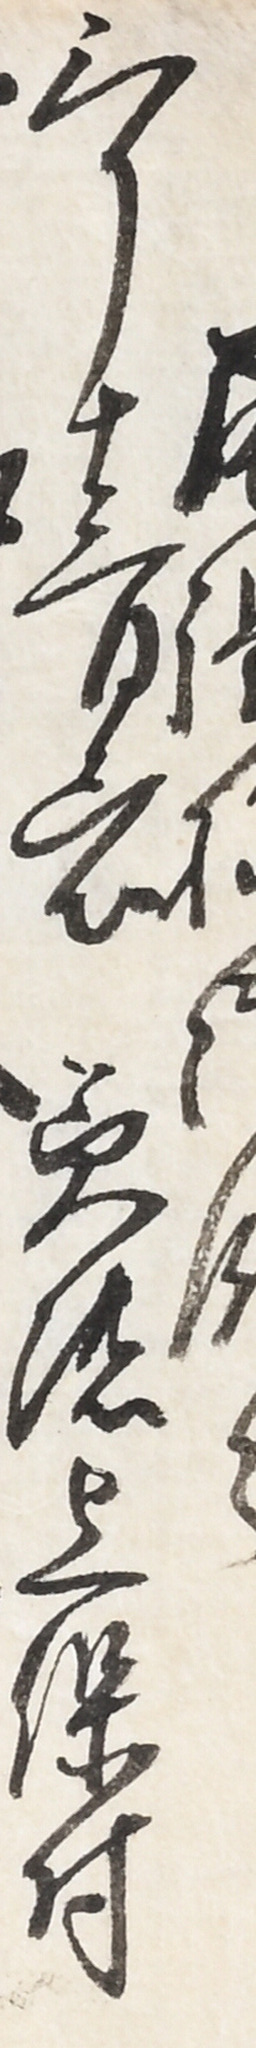三月十三日着美濃上保村
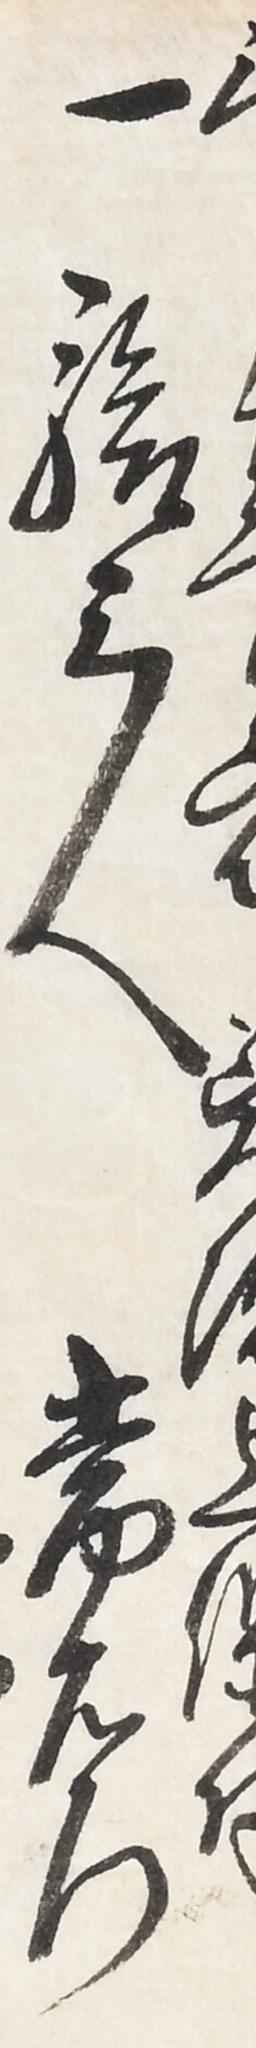一旅三人常左衛門
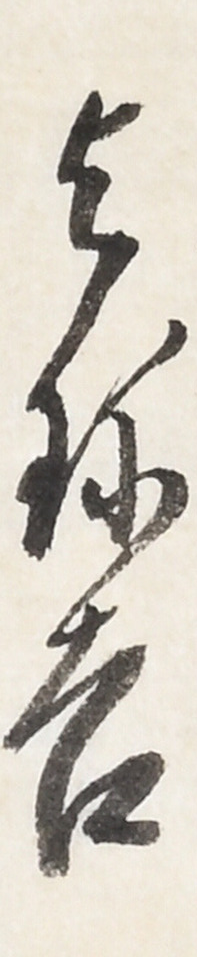与珍吉
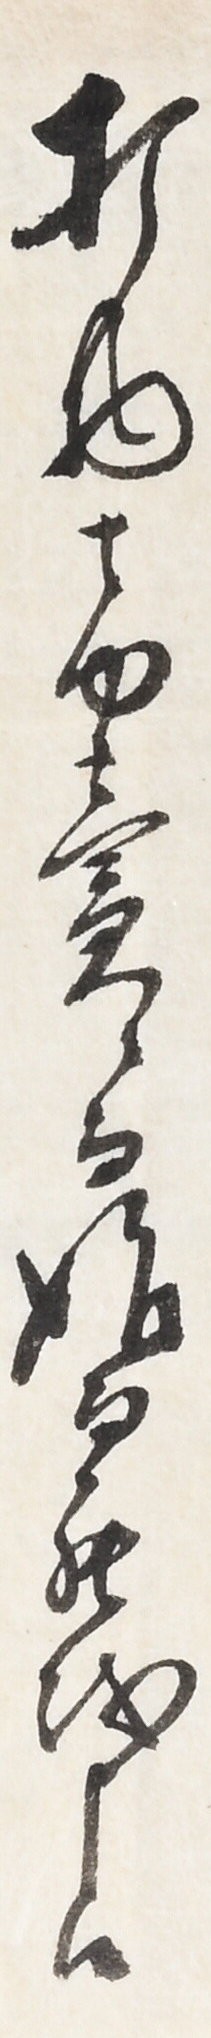打物商売ニ而始而罷越申候
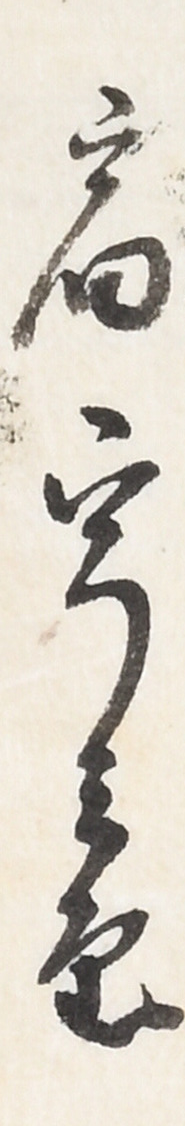宿宇兵衛
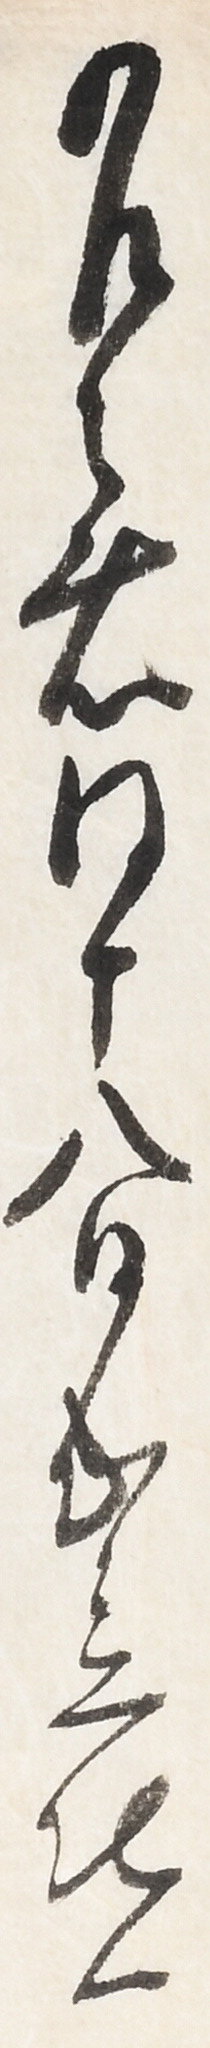右之者同十八日出立仕候
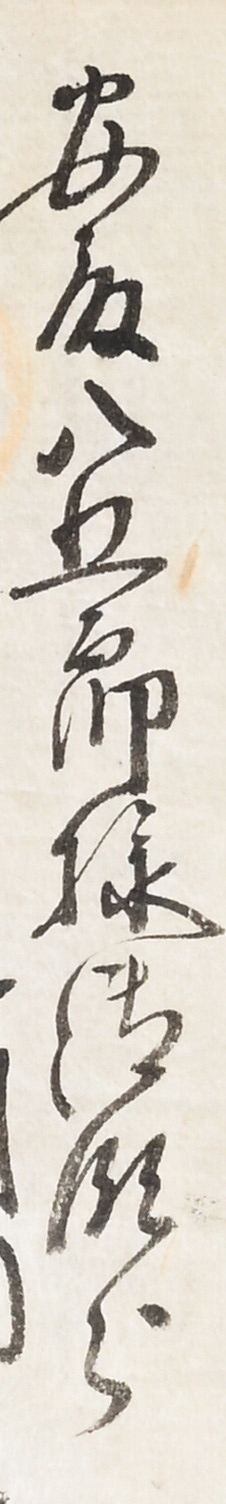安藤八五郎様御領分
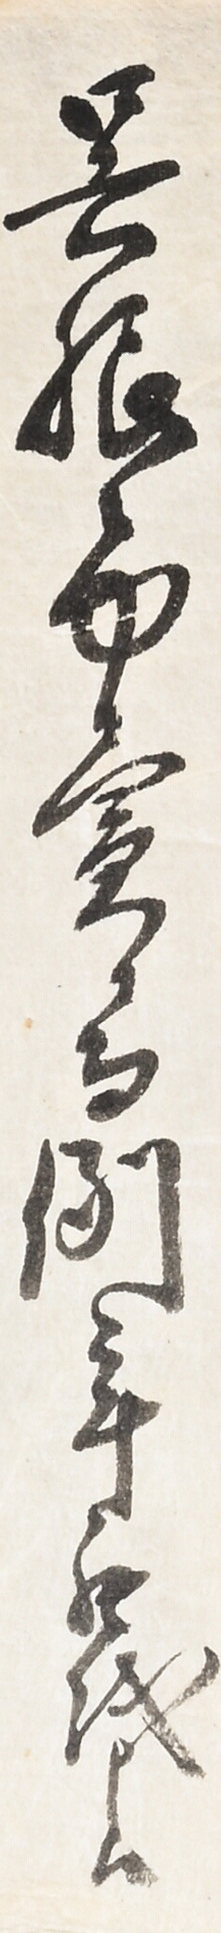呉服商売ニ而例年罷越申候
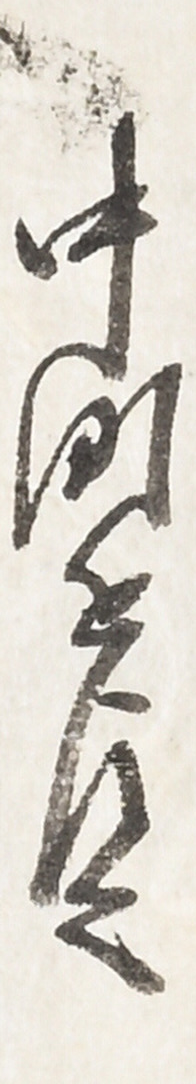中町近江屋
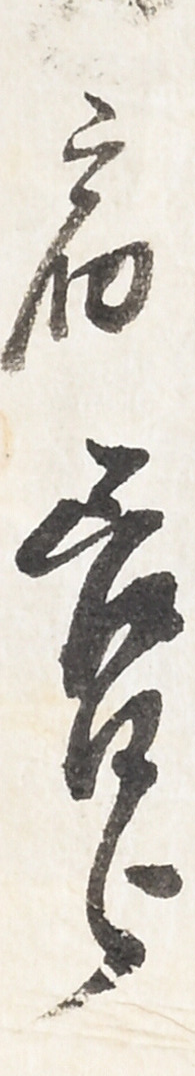宿善四郎
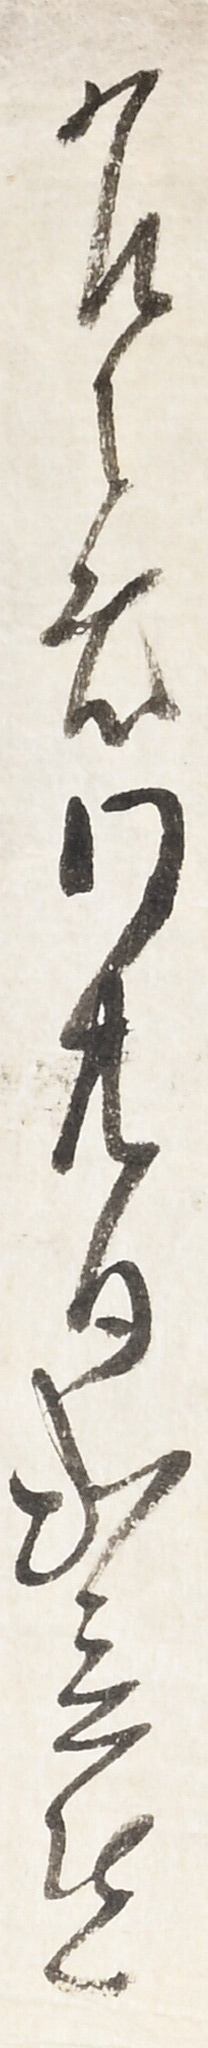右之者同廿日出立仕候
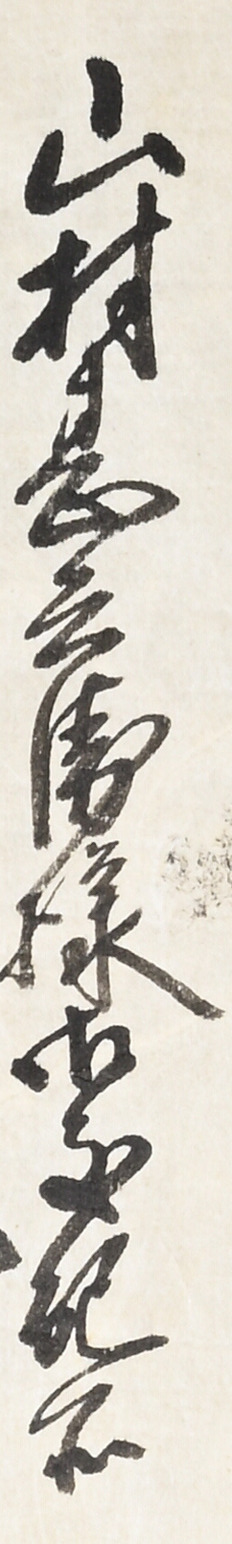山村甚兵衛様御支配所
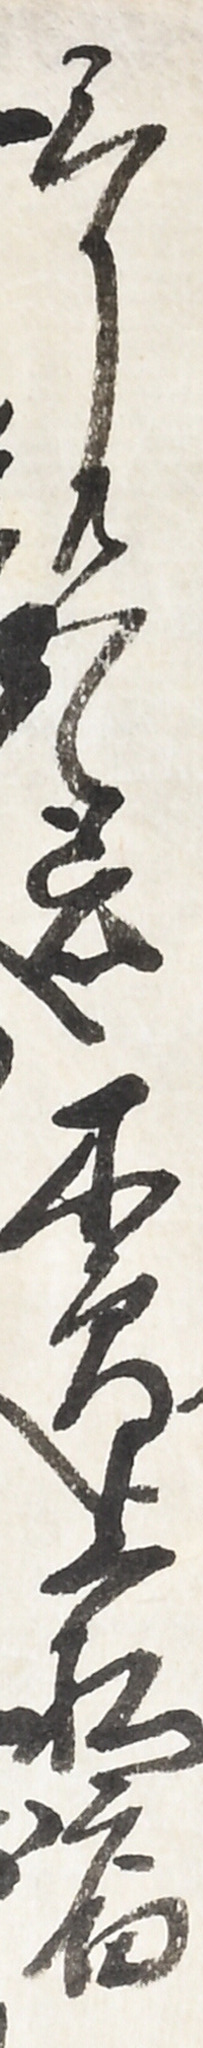参月廿一日着木曽上松宿
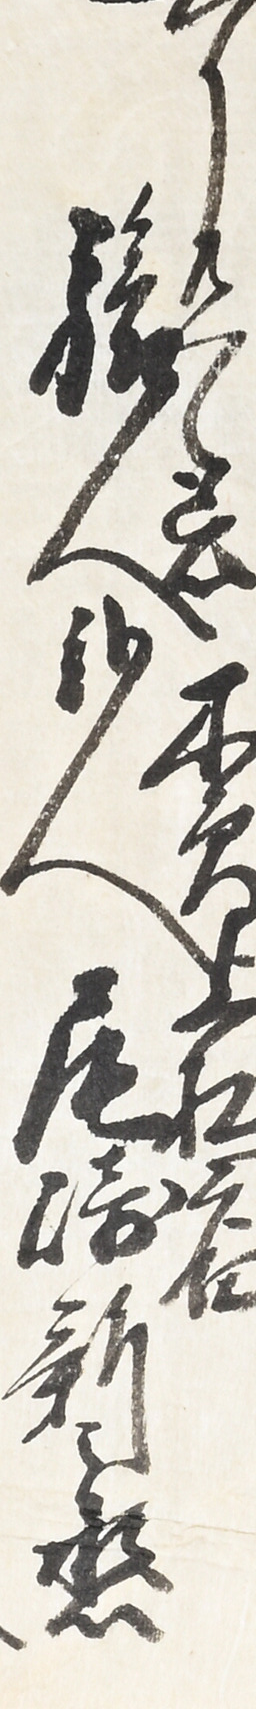一旅人弐人尾崎新之丞
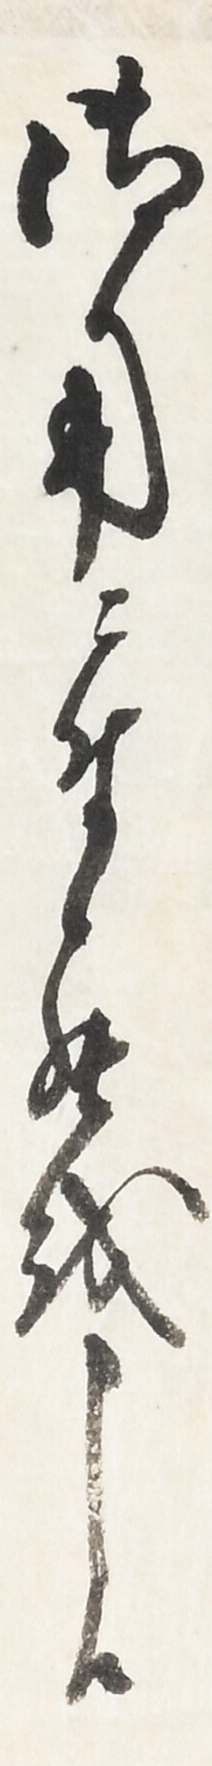御用ニ付罷越申候
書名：旅人泊控帳
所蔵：伊那市立高遠町図書館・合同会社AMANE
